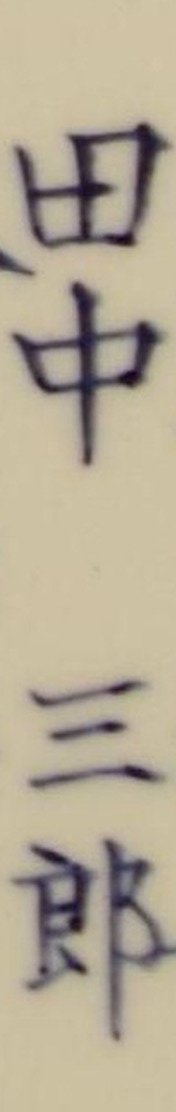田中三郎
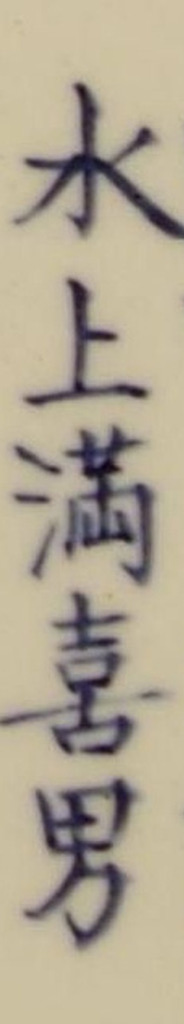水上満喜男
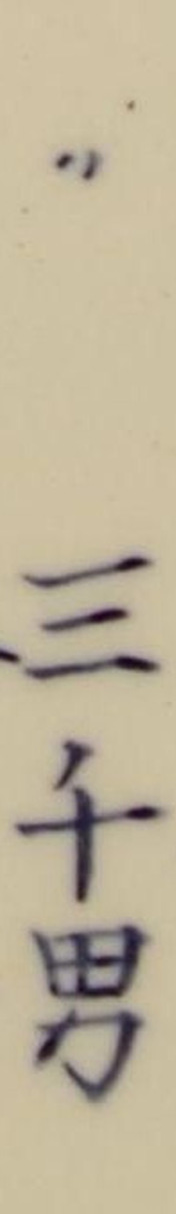三千男
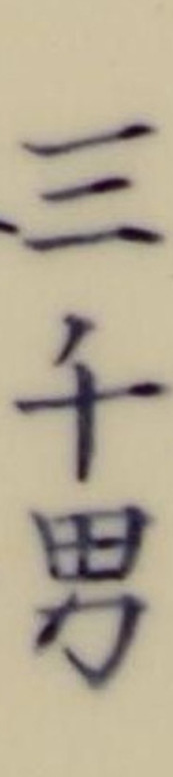三千男
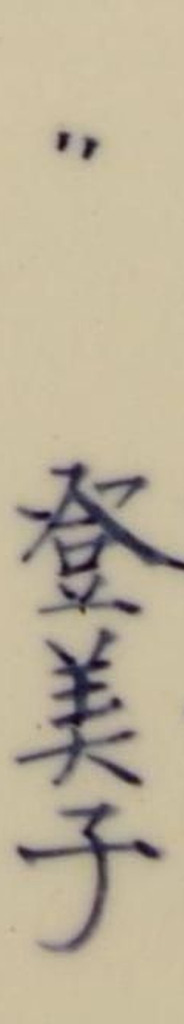登美子
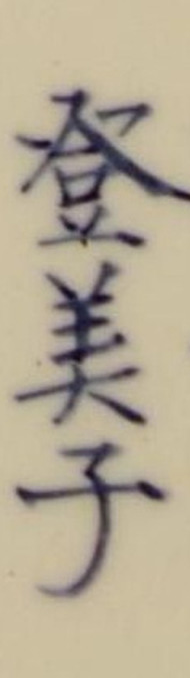登美子
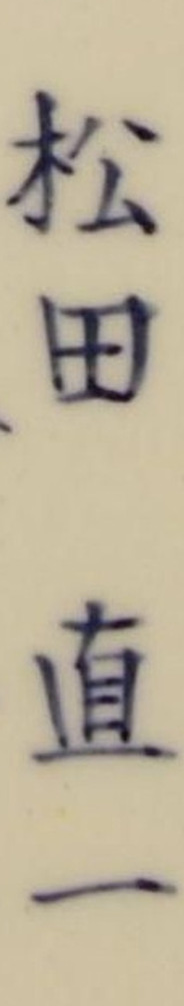松田直一
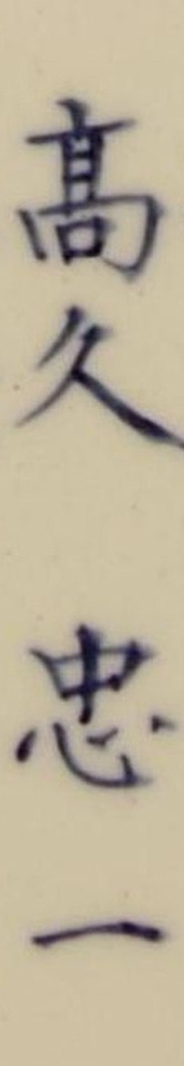高久忠一
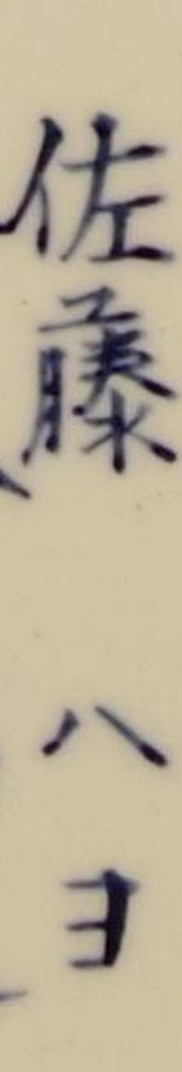佐藤ハヨ
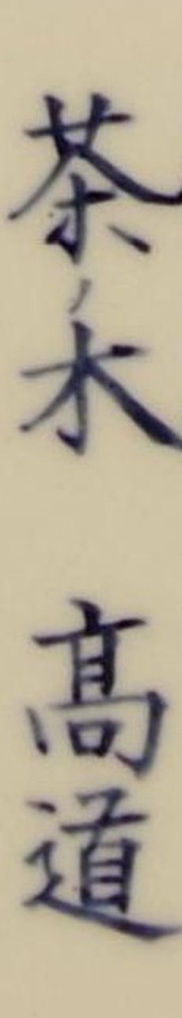茶木高道
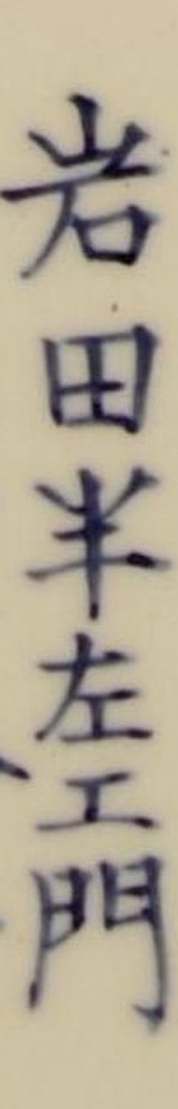岩田半左エ門
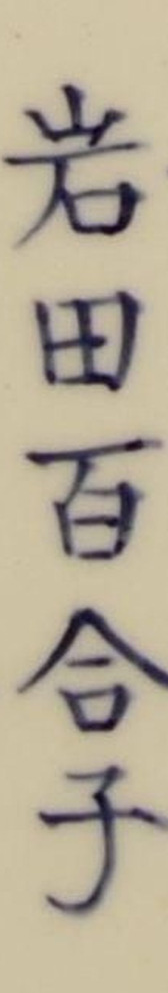岩田百合子
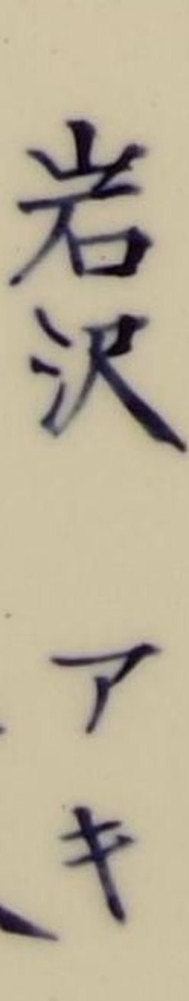岩沢アキ
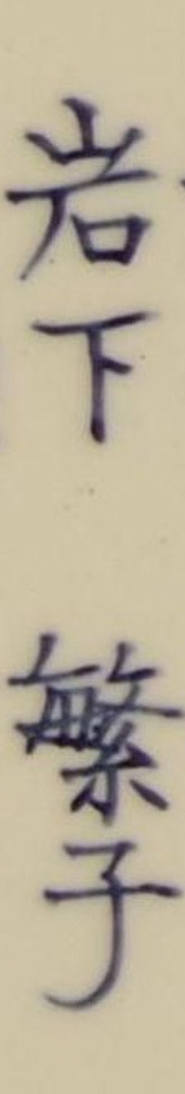岩下繁子
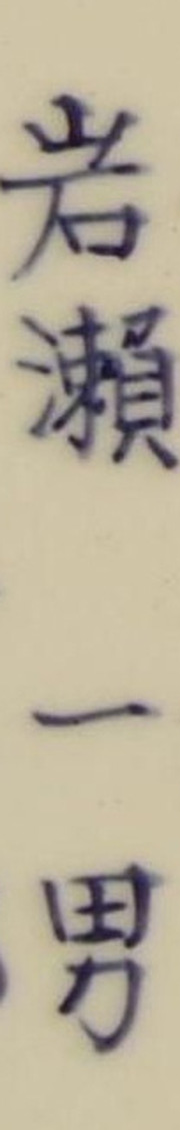岩瀬一男
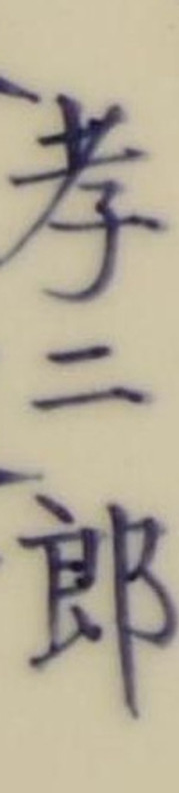孝二郎
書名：E~L
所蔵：高野山金剛峯寺
